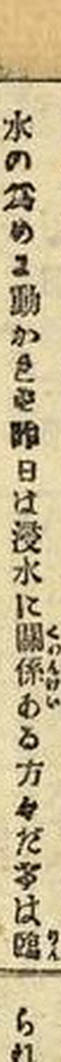水の為めに動かれず昨日は浸水に関係ある方々だけは臨
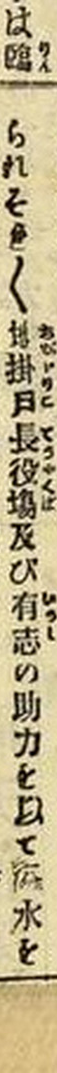られそれ〳〵地掛戸長役場及び有志の助力を以て溢水を
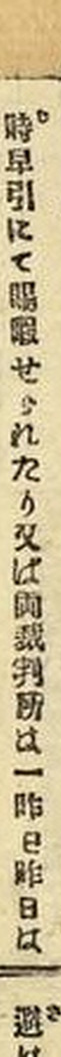時早引にて賜暇せられたり又は両裁判所は一昨日昨日は
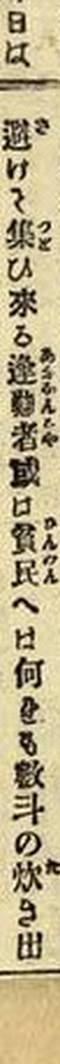避けて集ひ来る逢難者或は貧民へは何れも数斗の炊き出
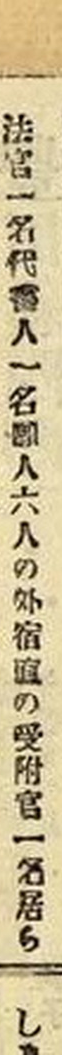法官一名代書人一名願人六名の外宿直の受付官一名居ら
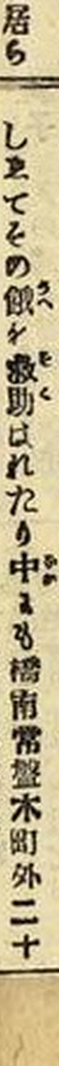ししてその餓を救助はれたり中にも橋南常盤木町外二十
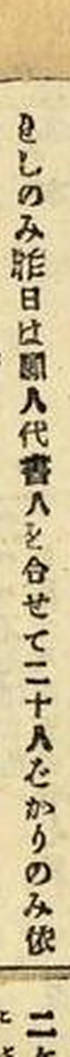れしのみ昨日は願人代書人を合せて二十人ばかりのみ依
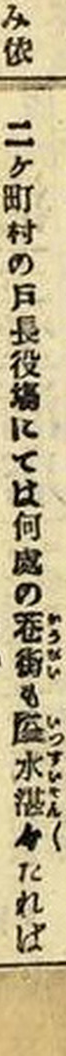二ヶ町村の戸長役場にては何処の巷街も溢水湛々たれば
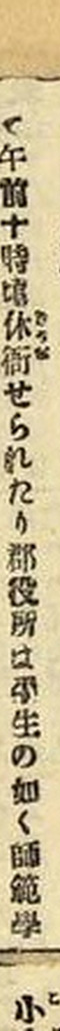て午前十時頃休衙せられたり郡役所は平生の如く師範学
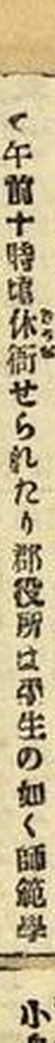て午前十時頃休衙せられたり郡役所は平生の如く師範学
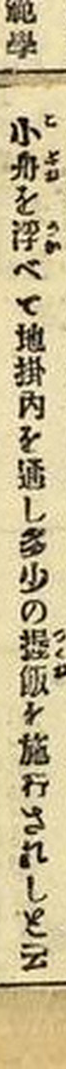小舟を浮べて地掛内を通し多少の握飯を施行されしと云
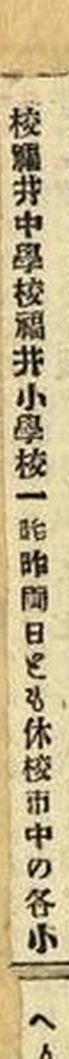校福井中学校福井小学校一昨昨両日とも休校市中の各小

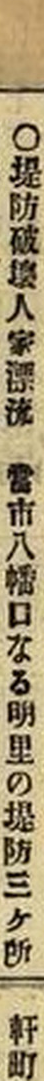○堤防破壊人家漂流当市八幡口なる明里の堤防三ヶ所
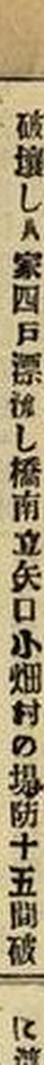破壊し人家四戸漂流し橋南立矢口小畑村の堤防十五間破
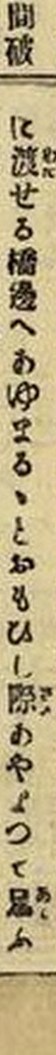に渡せる橋邊にあゆまるゝとおもひし際あやまつて足ふ
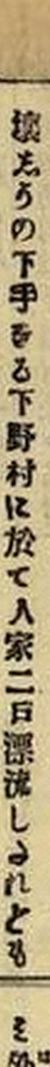壊しかの下手なる下野村に於て人家二戸漂流したれども
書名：温古集 五巻
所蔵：福井県文書館 Fukui Prefectural Archives
